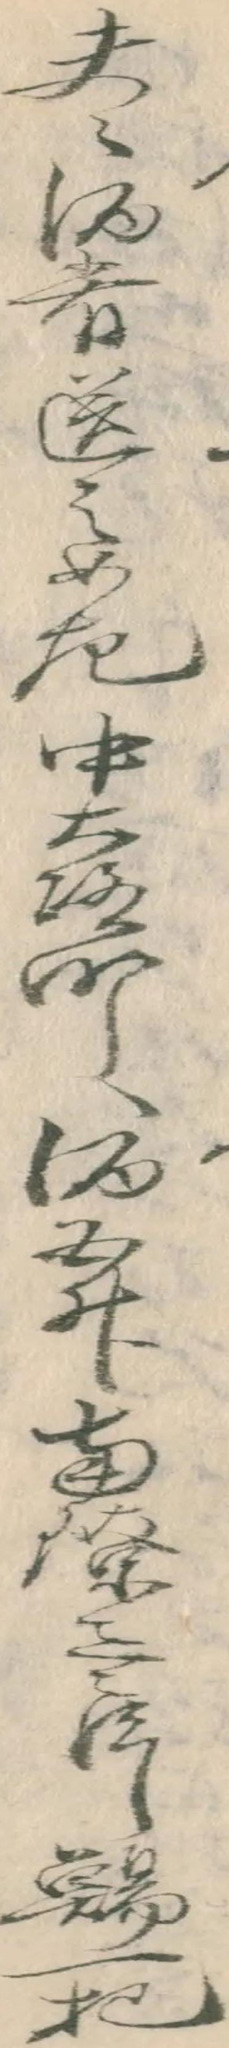夫々酒肴送之如左中大路町へ酒五升南鐐壱方鯣一把
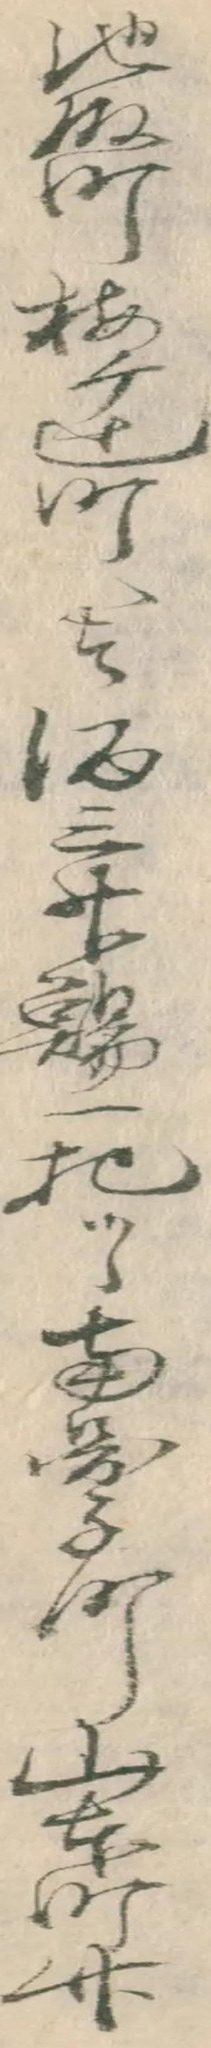池尻町梅ケ辻町へは酒三升鯣一把ツヽ南図子町山本町竹
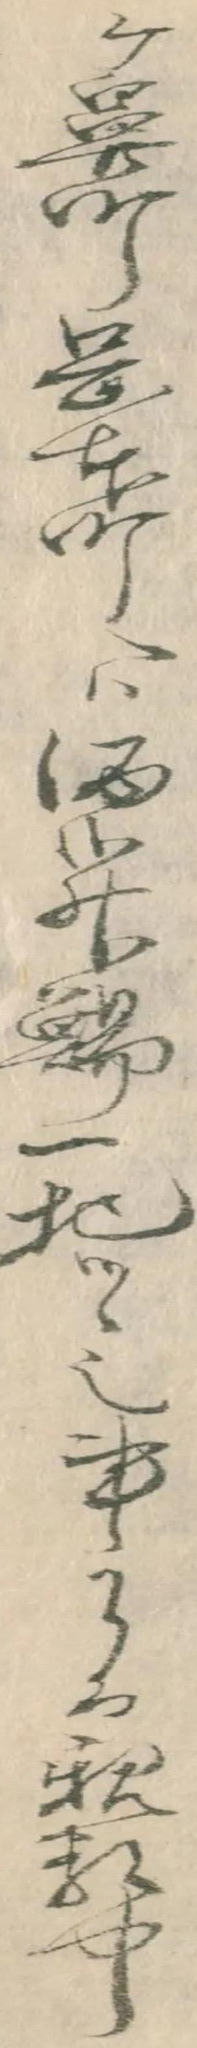ケ鼻町岡本町へハ酒弐升錫一把ツヽ之事了而親類中
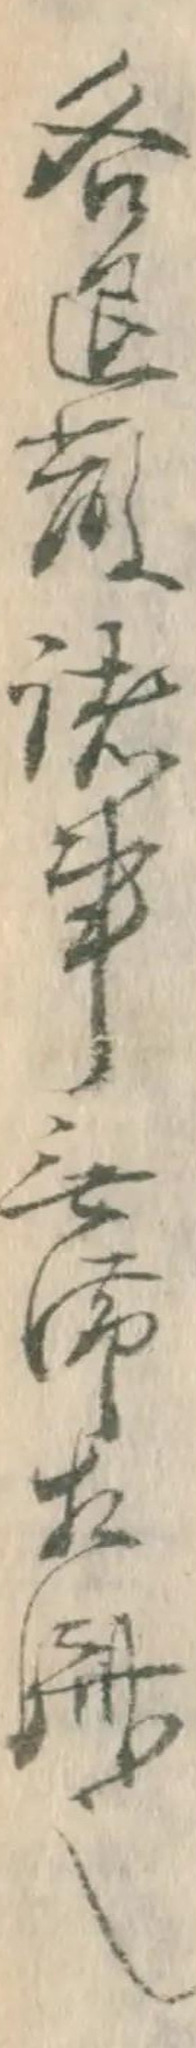各退散諸事無滞相済也

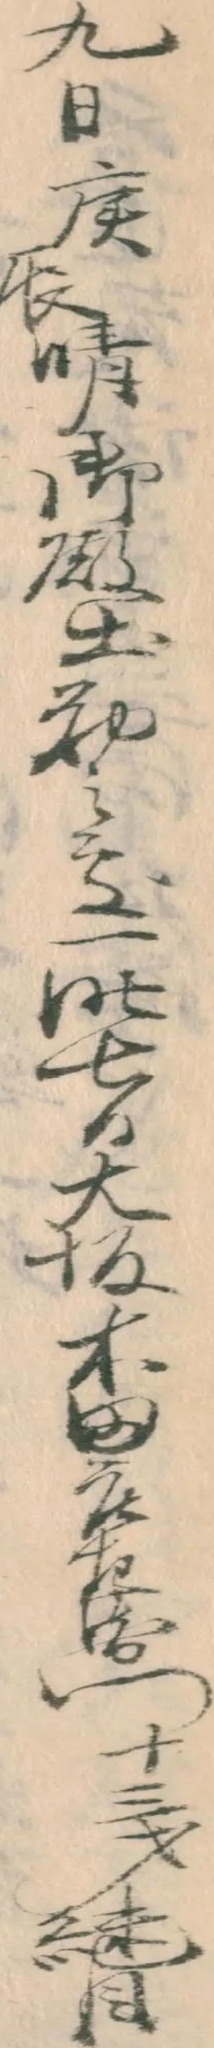九日庚戌晴御殿出勤之處一昨七日大坂木田善左衛門十三才継目
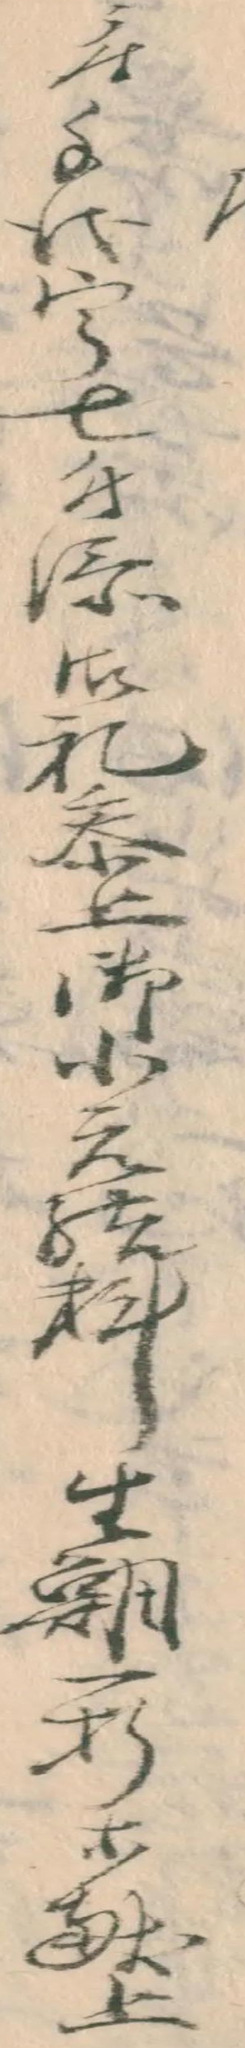ニ付手代宇七付添御礼参上御小元結料生鯛一折等献上
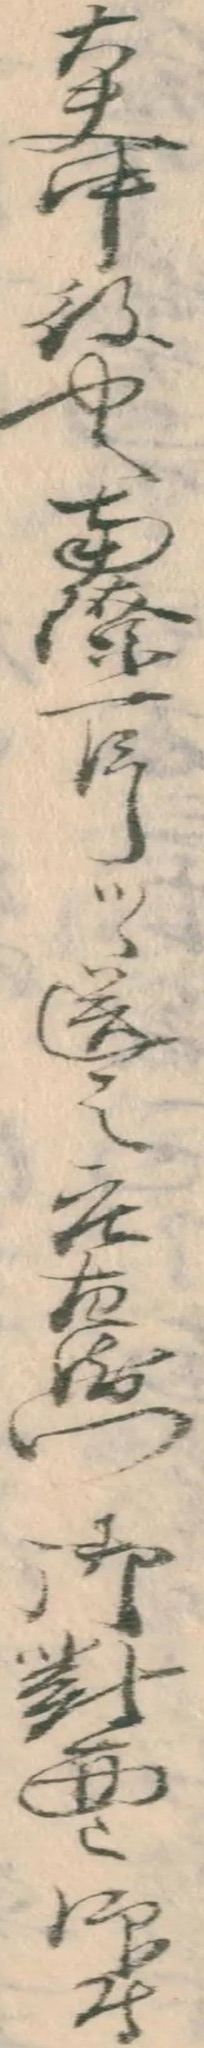大夫中役中へ南鐐一片ツヽ送之庄左衛門御對面被仰付
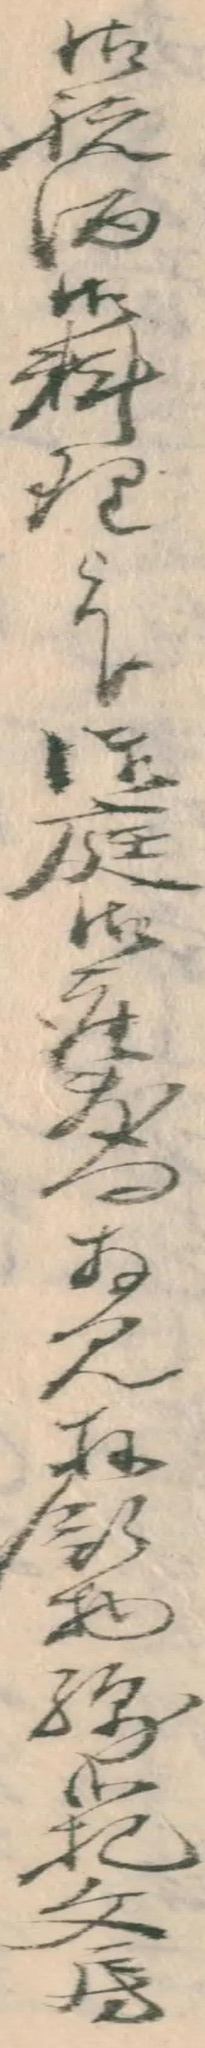御祝酒御料理被下御庭御座敷向拝見再領物綿御札文房
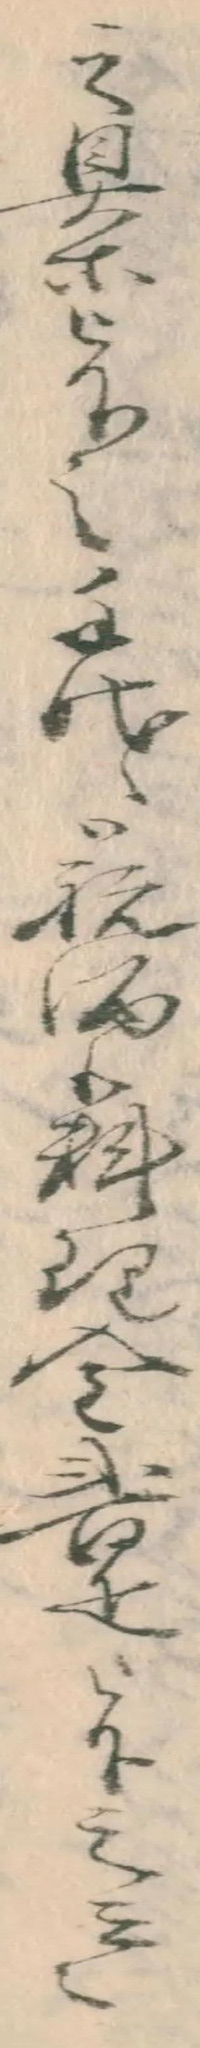之具等被下之手代へ御祝酒之料理金弐百疋被下之云々
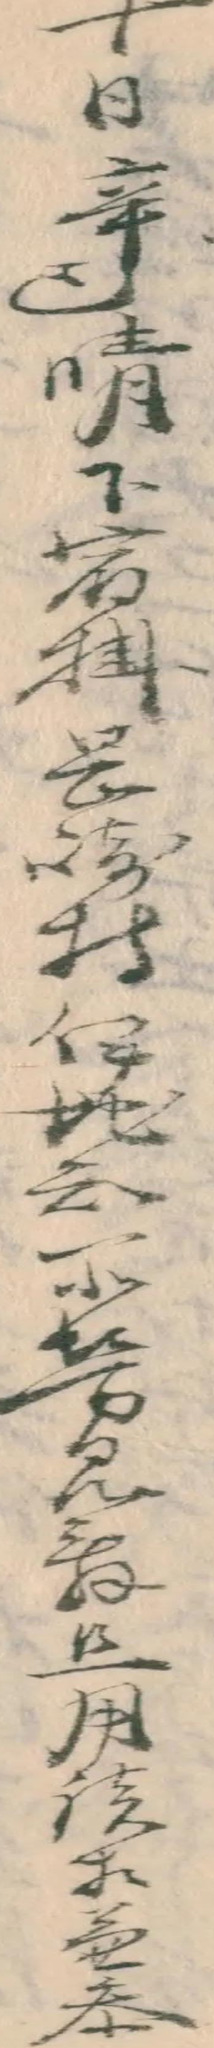十日辛巳晴下宿掛岡崎村伊地知所労見舞且用談相兼参
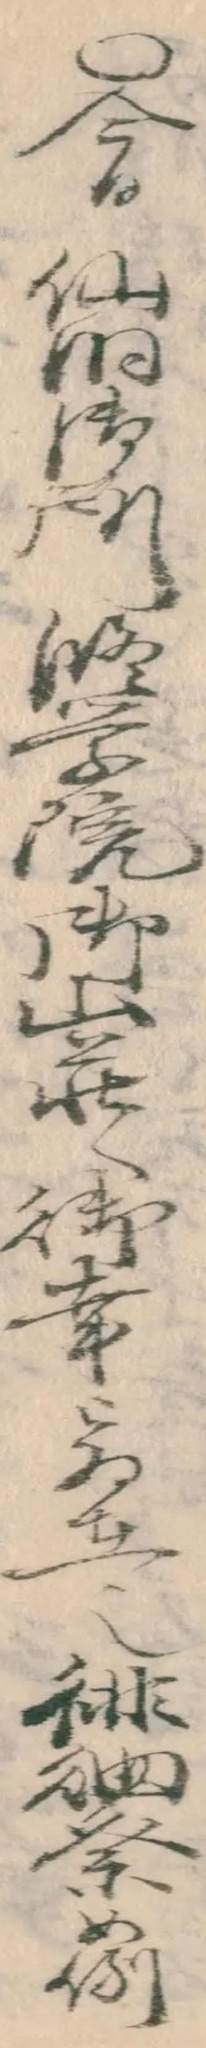○今日仙洞御所修学院御山荘へ御幸被為在之徘徊祭如例
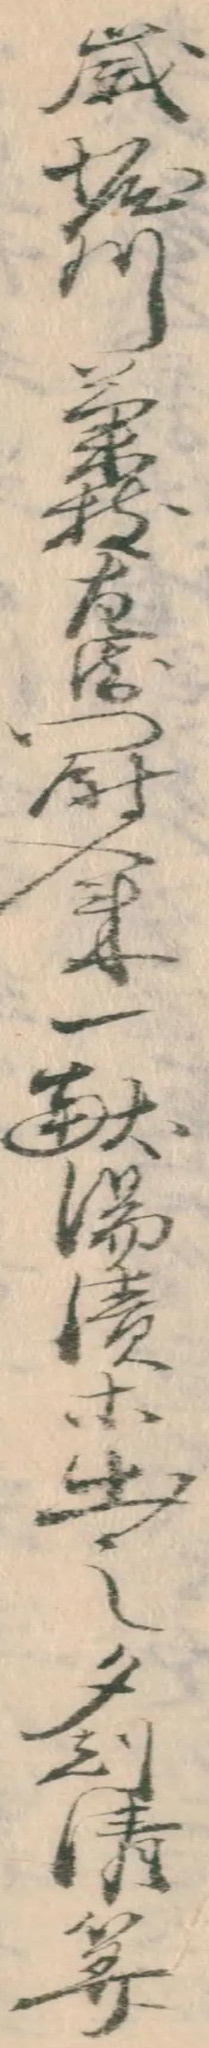歳堀川菊枝左衛門尉入来一献湯漬等出之夕刻清算
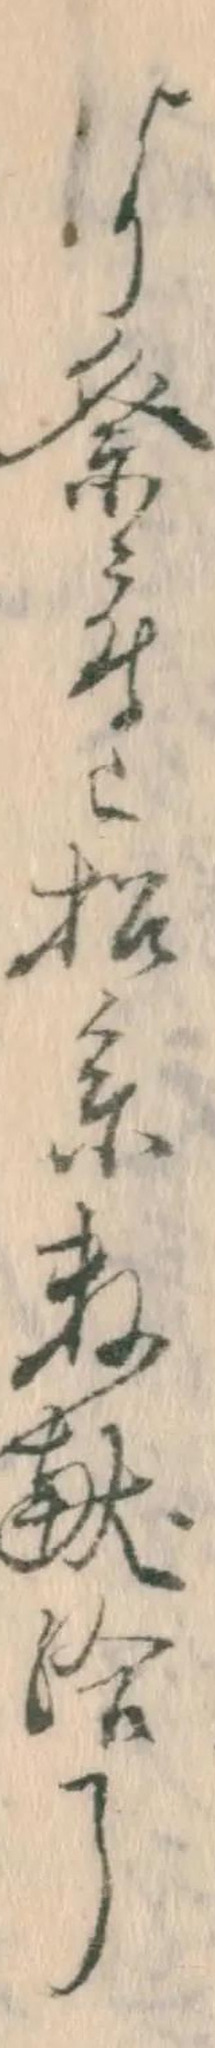より祭ニ付被招参数献給了
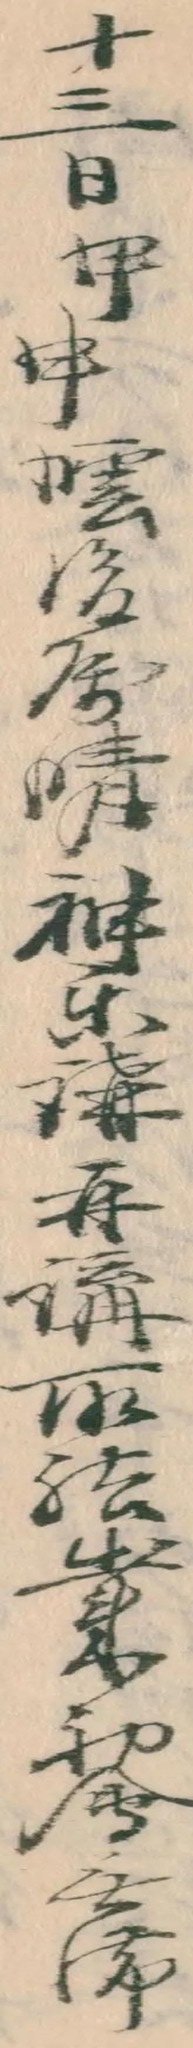十三日甲申曇後属晴神楽講再講取結出来初會無滞
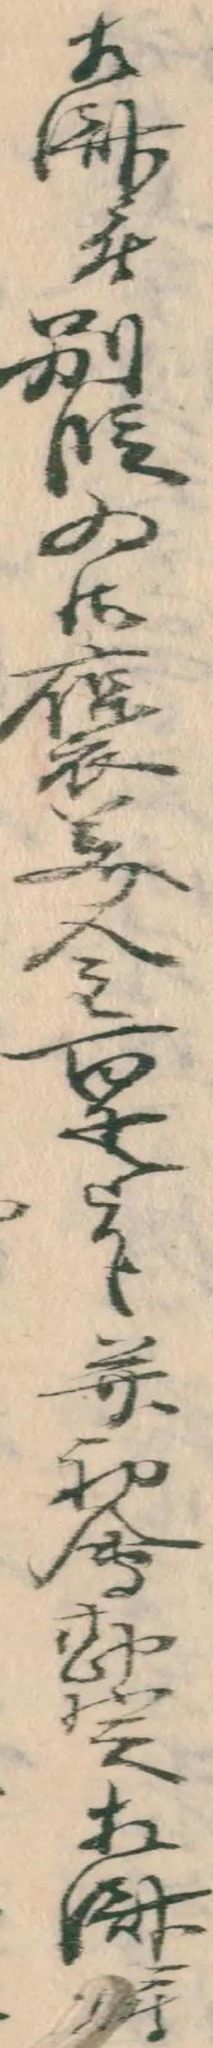相済ニ付別段為御褒美金百疋被下并初會勘定相済ニ付
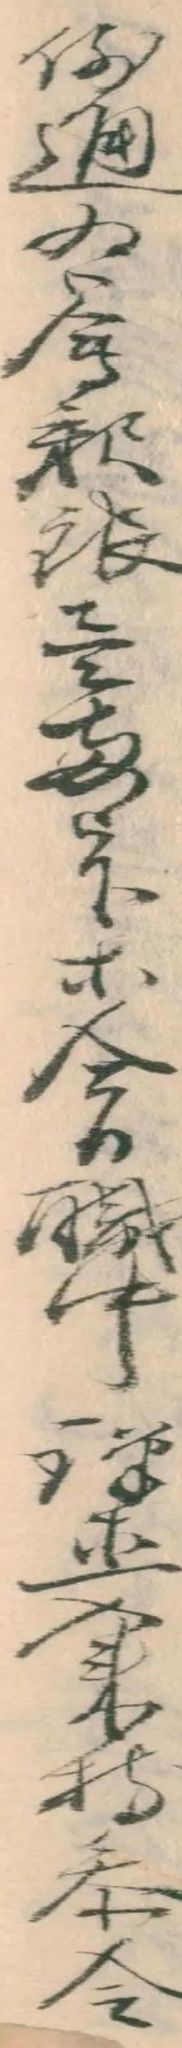例通為御會釈銀壱両被下等今日職中謹直入来持参令
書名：賀茂社記録. 第66冊
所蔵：国立国会図書館 National Diet Library, JAPAN
